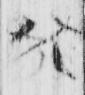癸
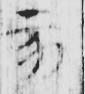亥
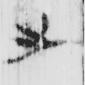之
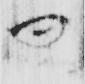日
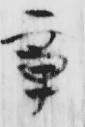章
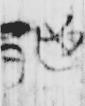○（越）
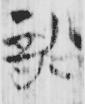訟
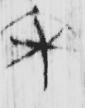宋
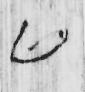㠯（以）
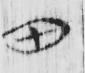田
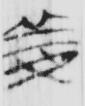義
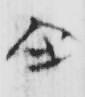牢
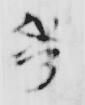秀
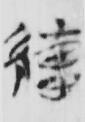○（紳）
